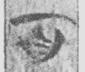百
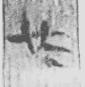廿=
